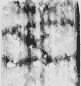正
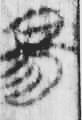昜（陽）
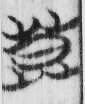莫
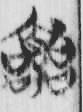囂
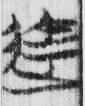達
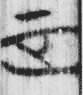正
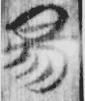昜
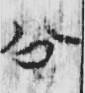公
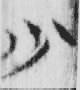少
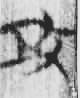攻
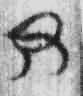尹
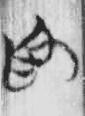爲
